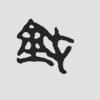{余土攴}
